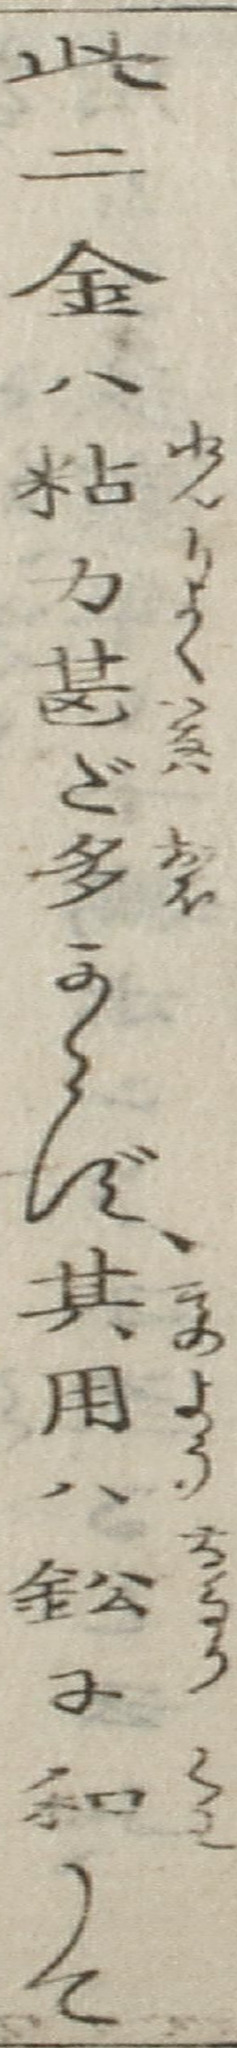此二金は粘力甚だ多からず、其用は鈆に和して
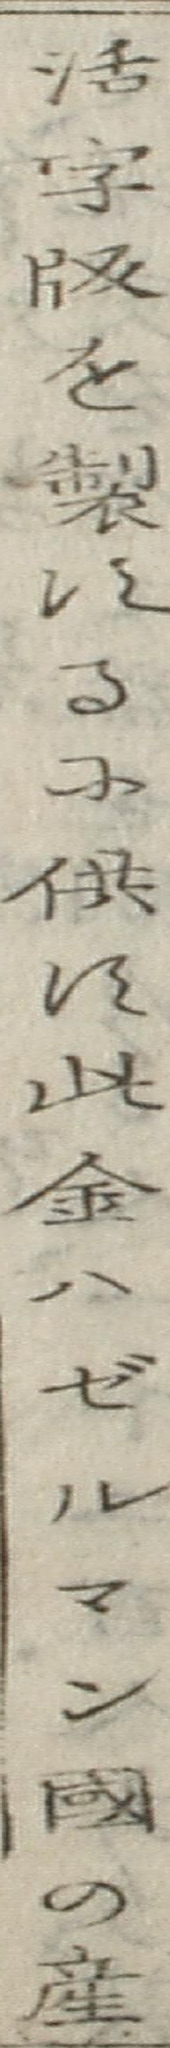活字版を製するに供す、此金はゼルマン国の産
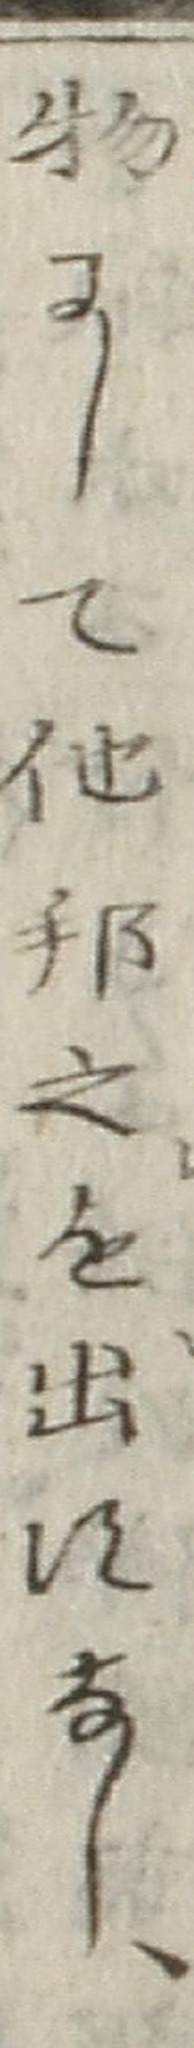物にして他邦之を出すなし、
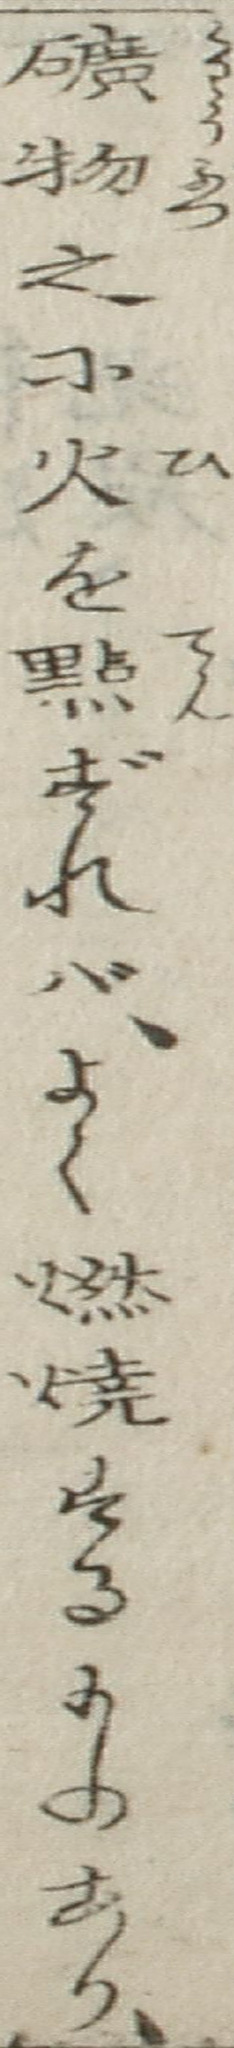砿物之に火を点ずれば、よく燃焼するものあり、
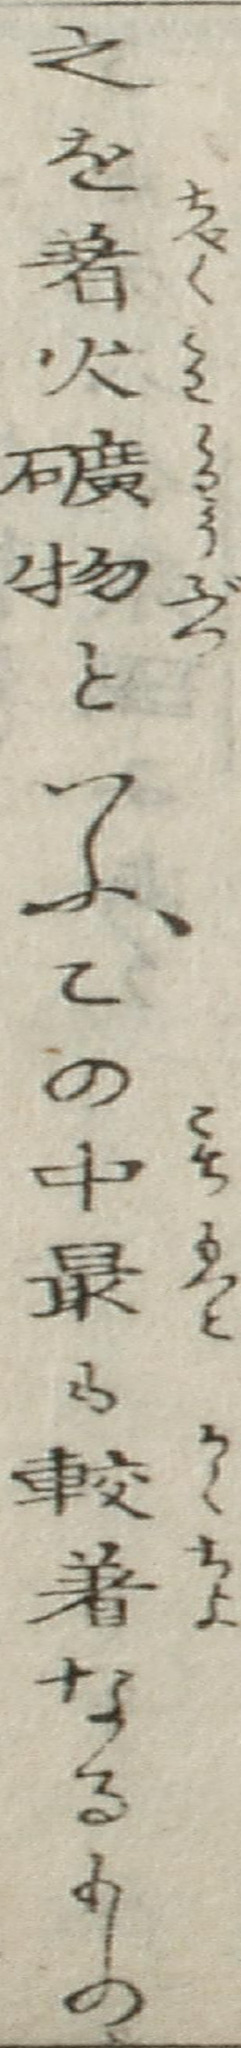之を着火砿物といふ、この中最も較著なるもの
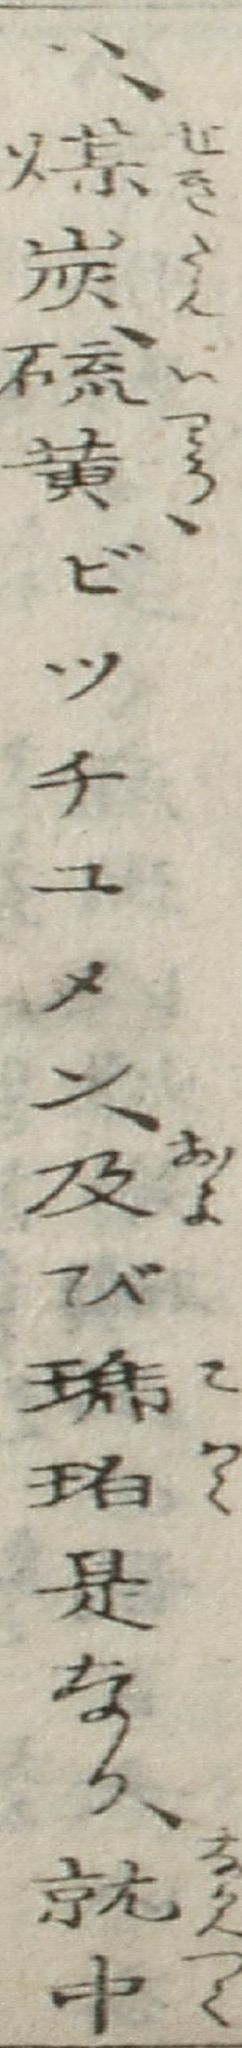、煤炭、硫黄、ビッチュメン、及び琥珀なり、就中
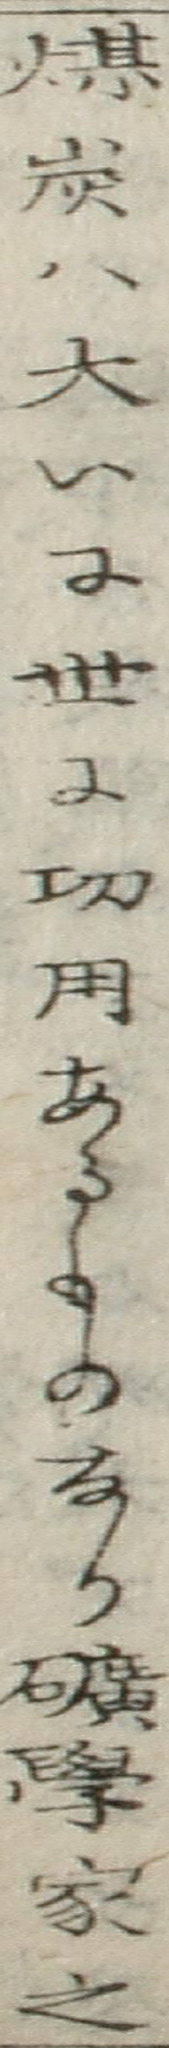煤炭は大いに世に功用あるものなり砿学家之
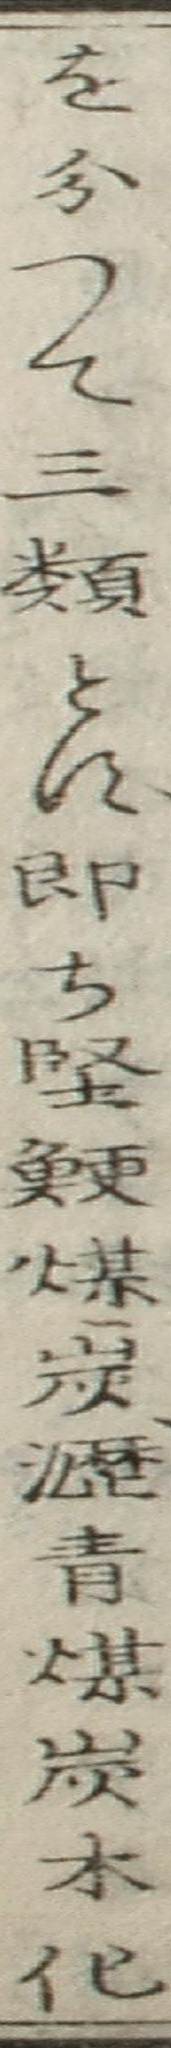を分つて三類とす、即ち堅硬煤炭、瀝青煤炭木化

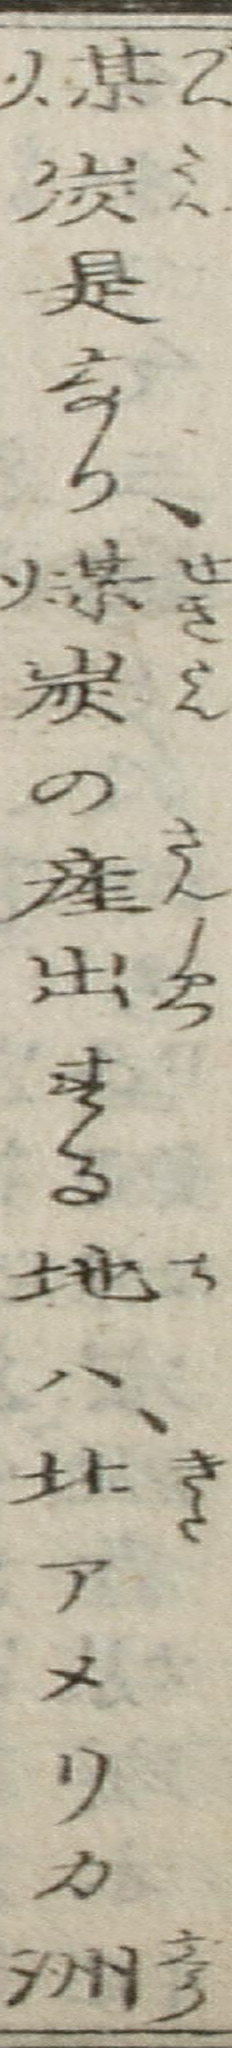煤炭是なり、煤炭の産出する地は、北アメリカ洲
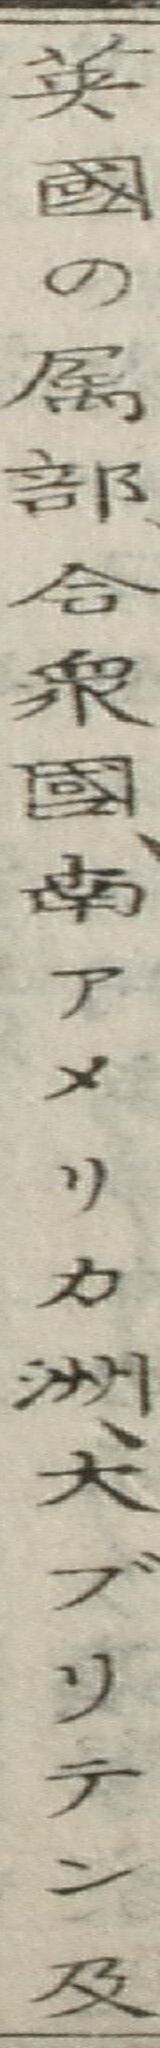英國の属部、合衆国、南アメリカ洲、大ブリテン及
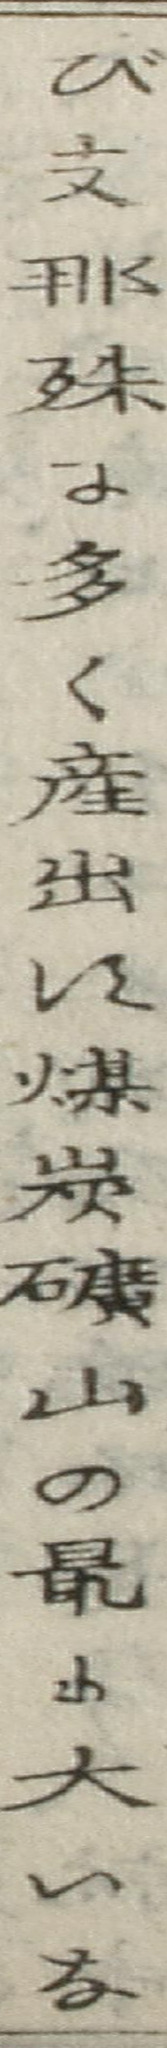び支那殊に多く産出す、煤炭砿山の最も大いな
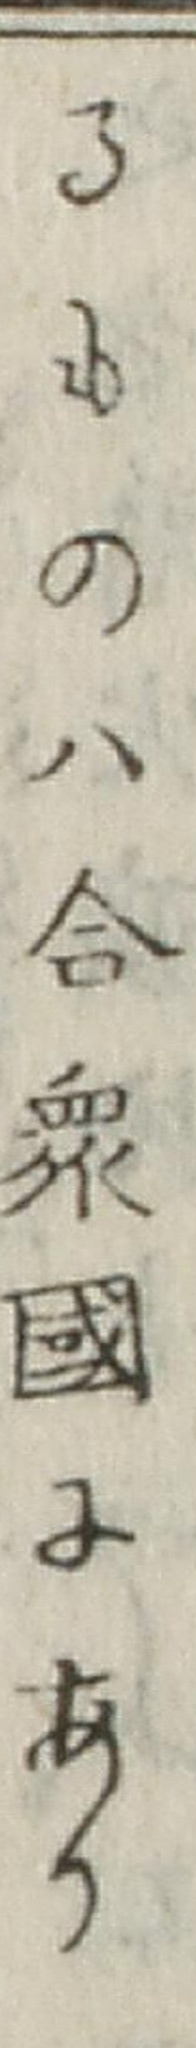るものは合衆国にあり
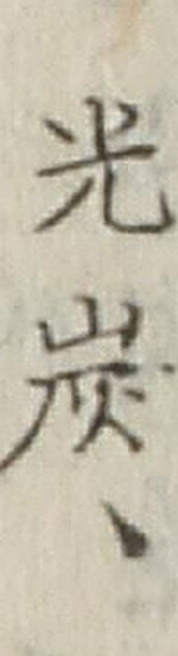光炭、
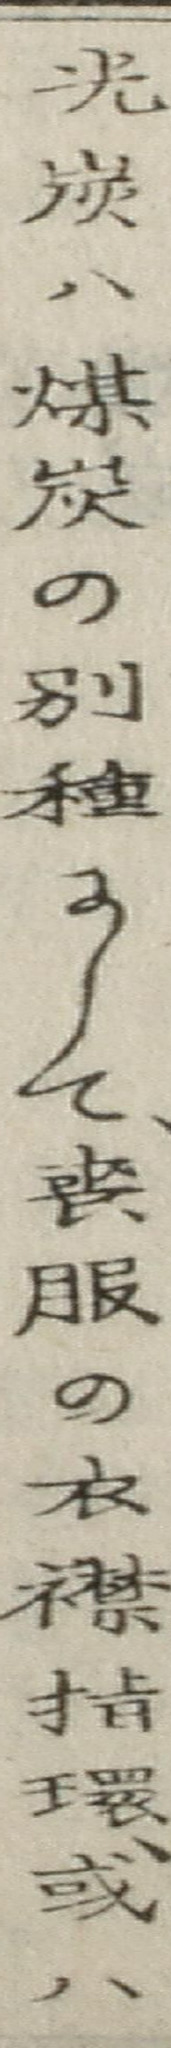光炭は煤炭の別種にして、喪服の衣襟、指環、或は
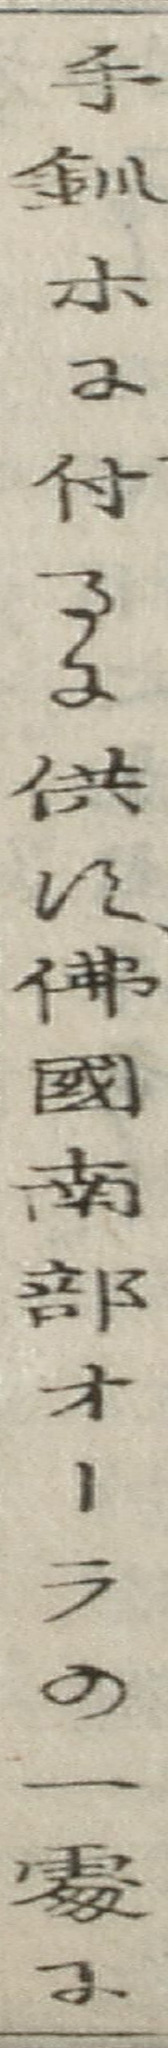手釧等に付るに供す、仏國南部オーラの一霄に
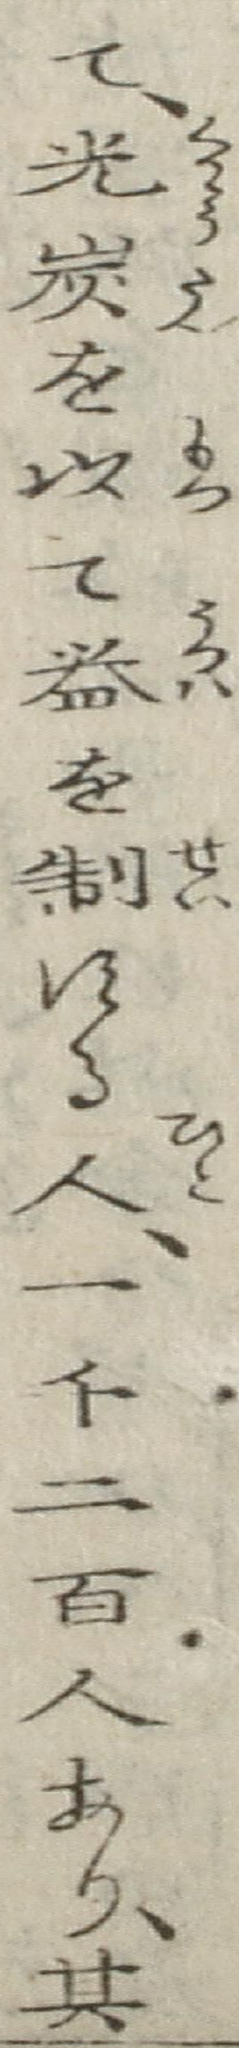て、光炭を以て器を制する人、一千二百人あり、其
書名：訓蒙　天然地理學　下
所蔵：東京大学地震研究所図書室 Earthquake Research Institute Library, The University of Tokyo, JAPAN
